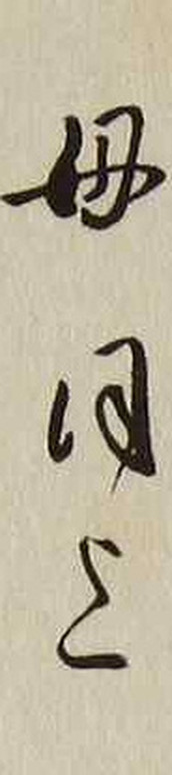母同上

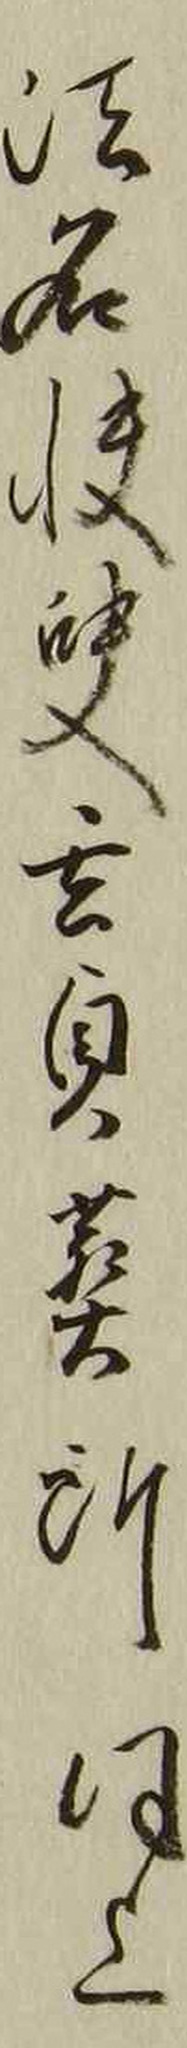法名快叟玄貞葬所同上
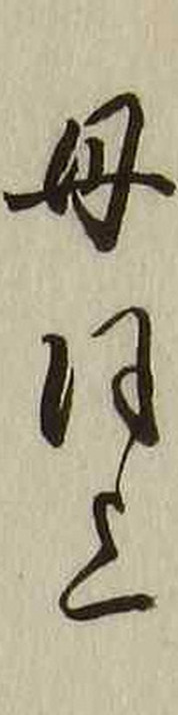母同上
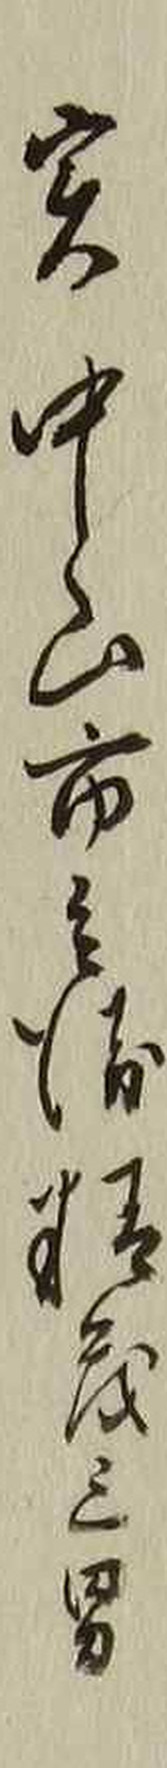実中山市兵衛精茂三男
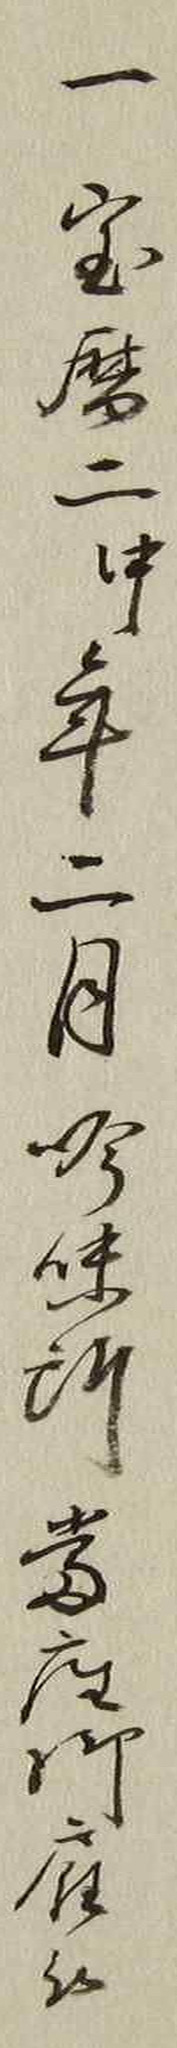一宝暦二申年二月吟味所当座御雇被
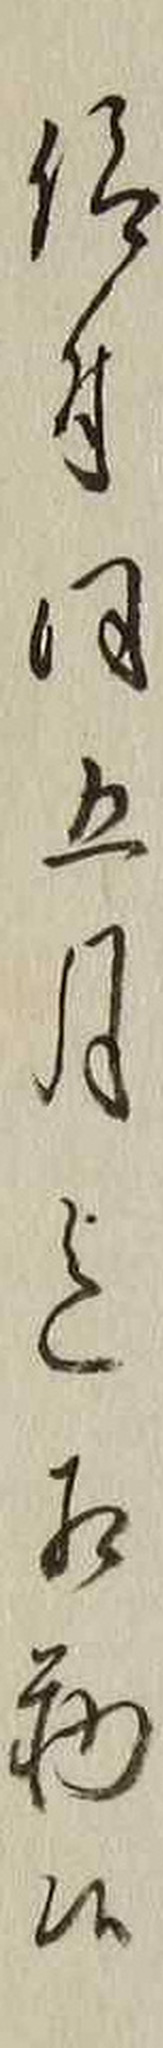仰付同五月迄相勤候
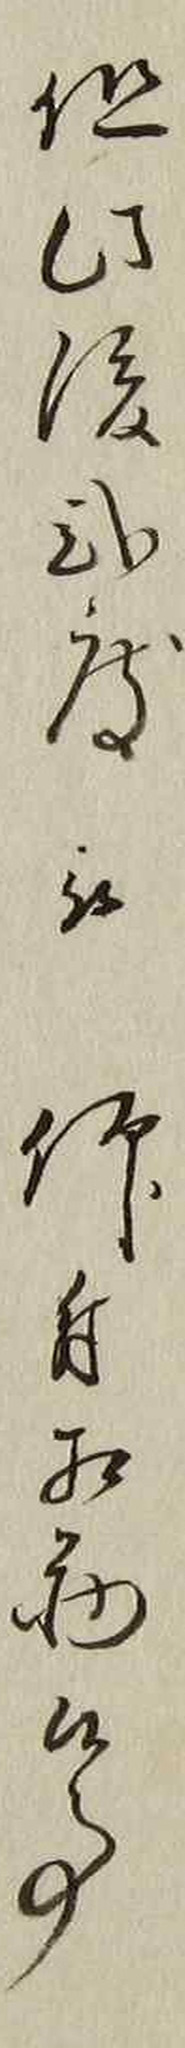但此後弐度被仰付相勤候事
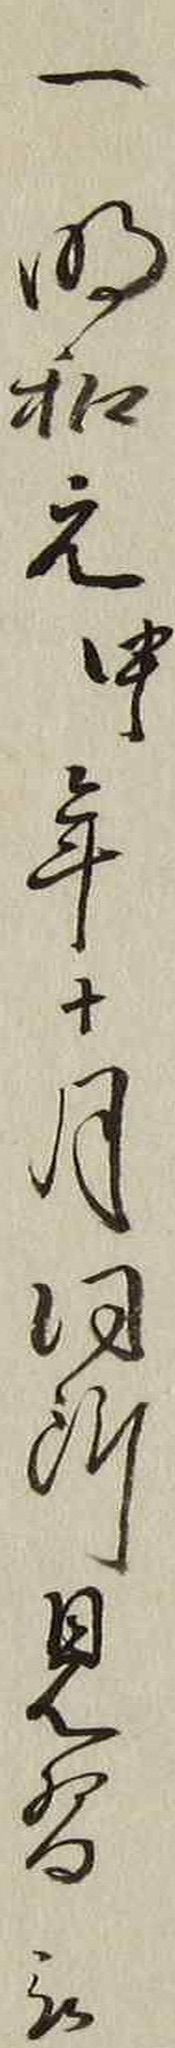一明和元申年十月同所見習被
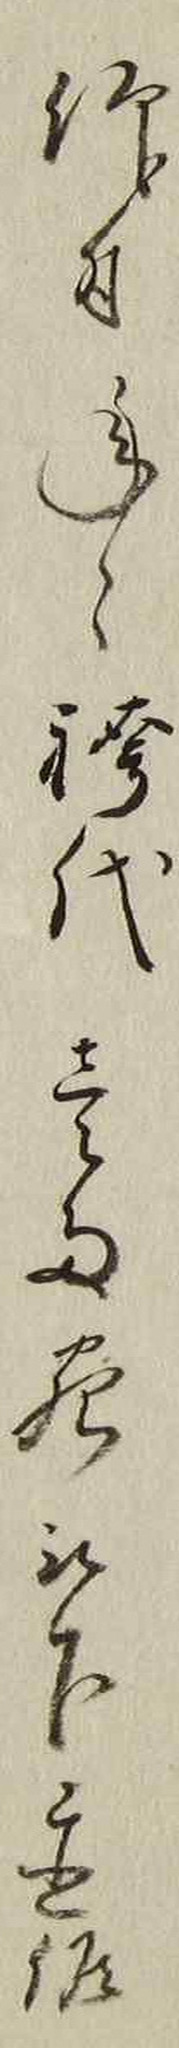仰付年々袴代壱両宛被下置候
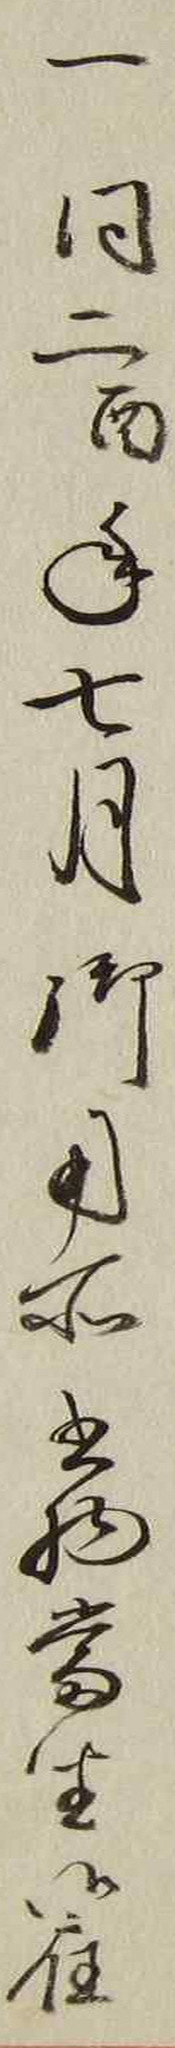一同二酉年七月御用所書物当坐御雇
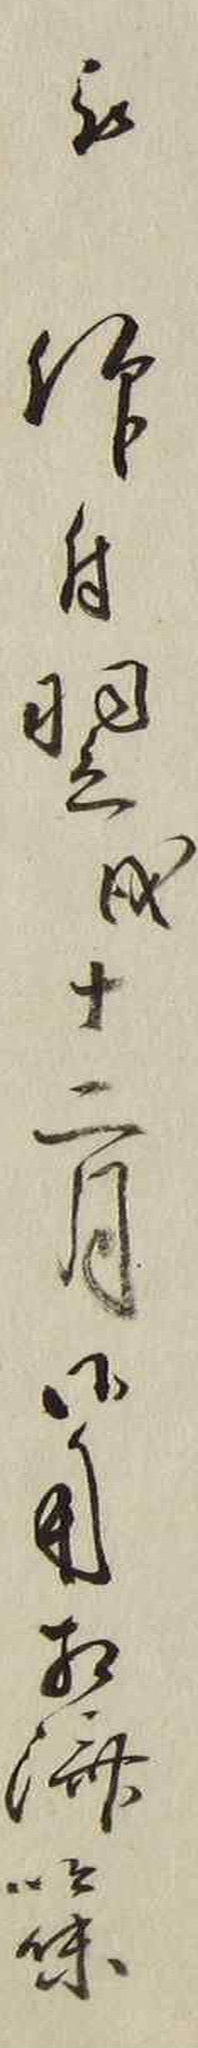被仰付翌戌十二月御用相済吟味

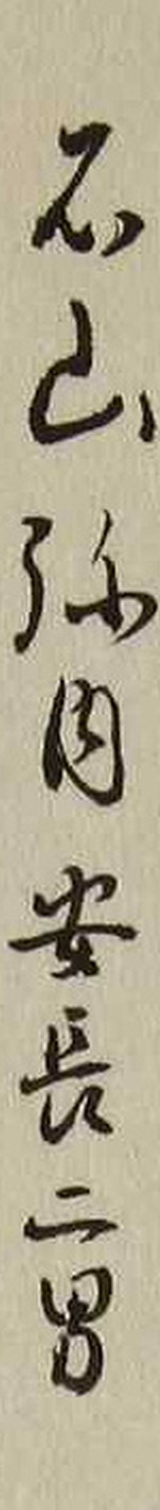石山弥内安長二男
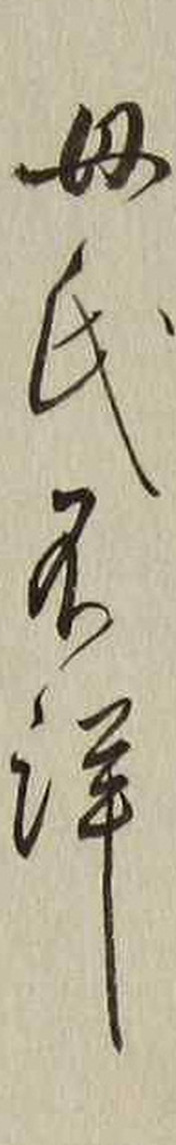母氏不詳
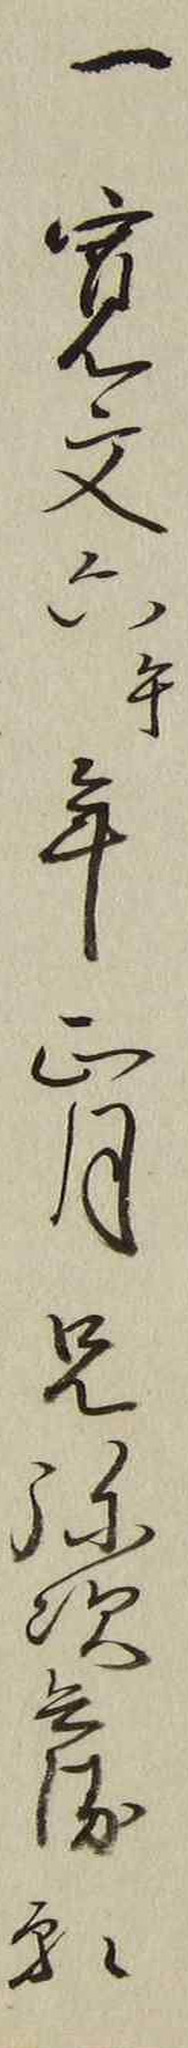一寛文六午年正月兄弥次兵衛願
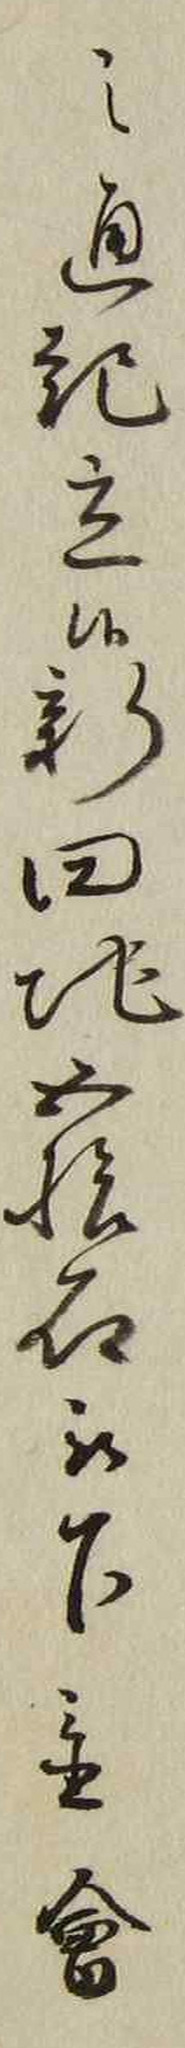之通起立候新田地五拾石被下置會

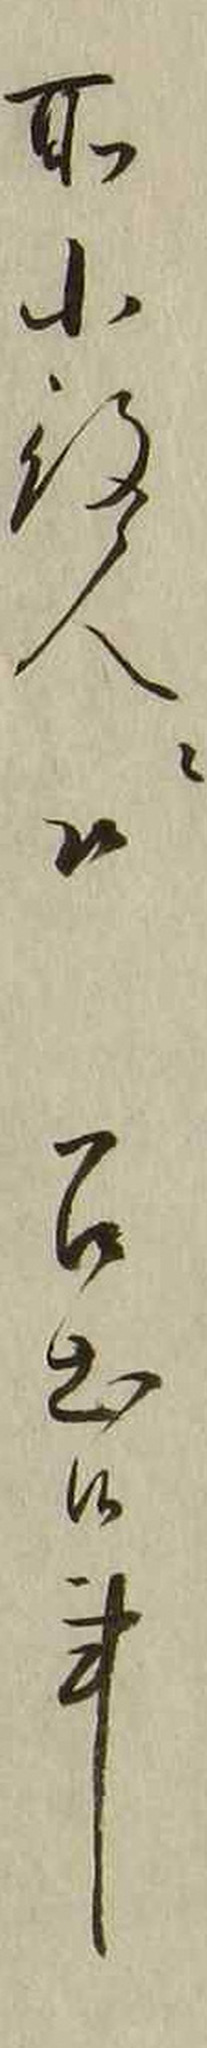所小役人に被召出候事
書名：諸士系譜　巻之6　い之部6
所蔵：会津若松市立会津図書館
